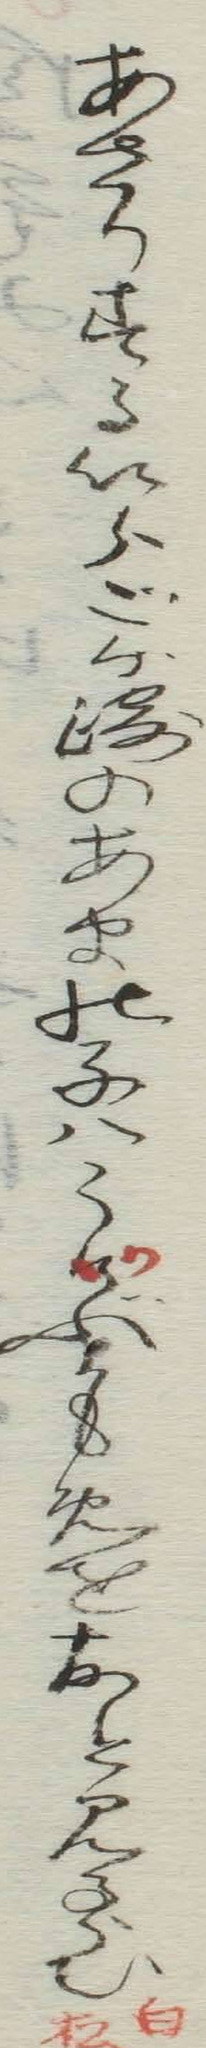あさりするいらごが崎のあまの子はうかぶかもめを友と見るらむ白松
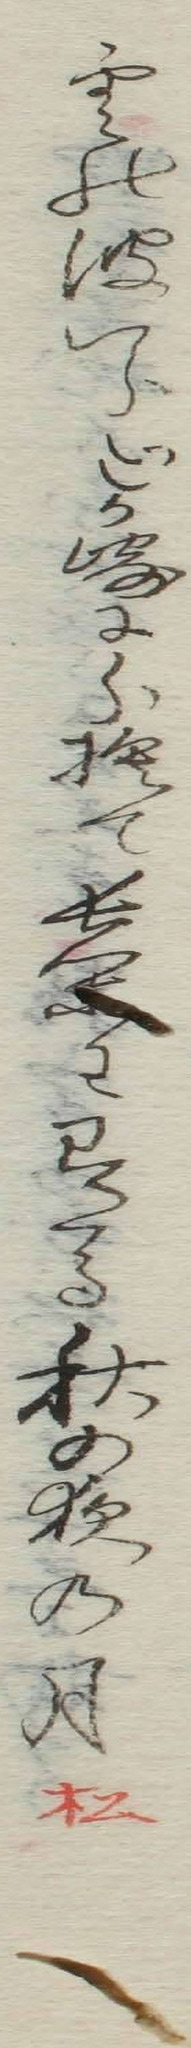雲の波いらごか崎に分捨て長閑にわたる秋の夜の月松
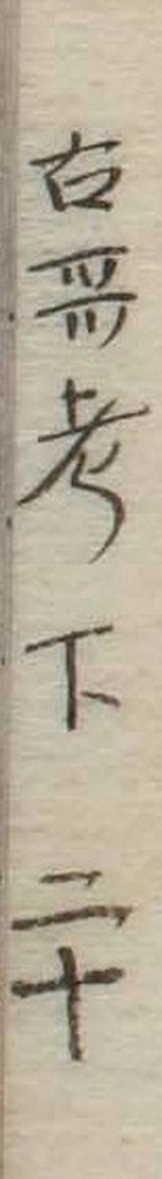古歌考下二十

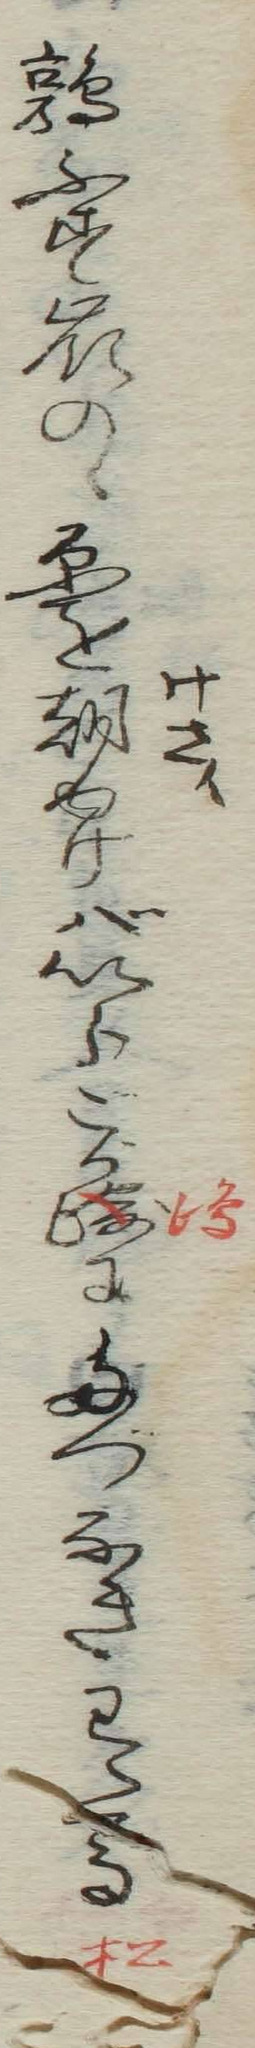鶉ふす嶺のゝ原を朝ゆけばいらこが嶋にたづなきわたる松
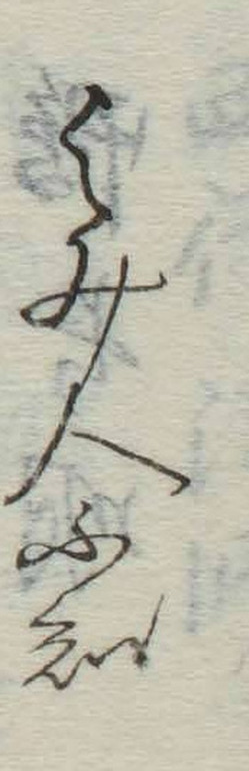よみ人不知
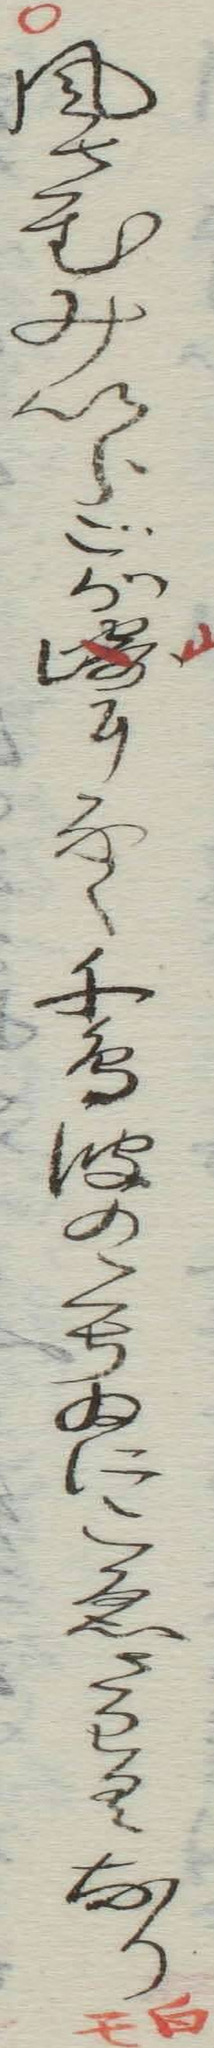○風さむみいらごが嶋になく千鳥波のたちゐにこゑさわぐなり白モ
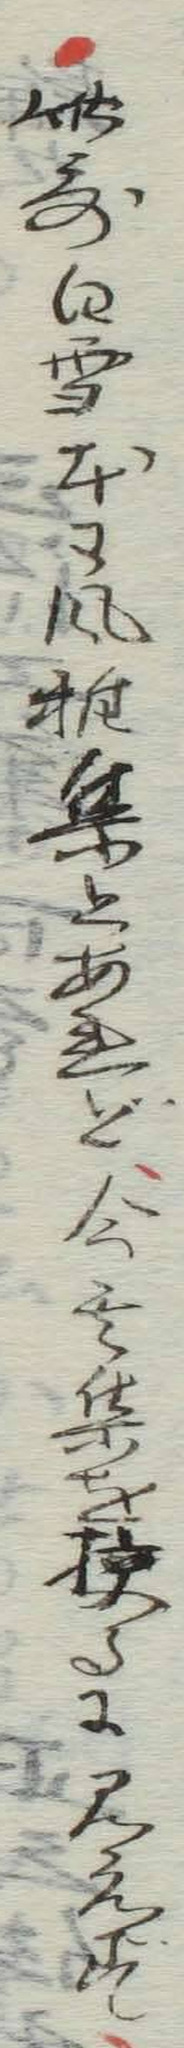●此歌白雪本に風雅集とあれど、今其集を校るに見えず、
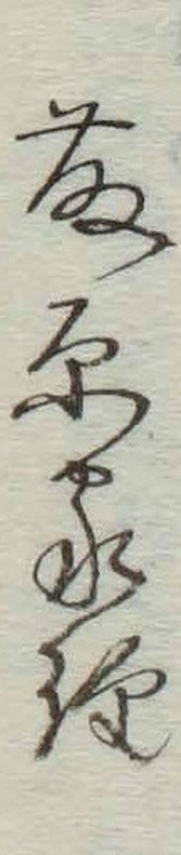藤原家経
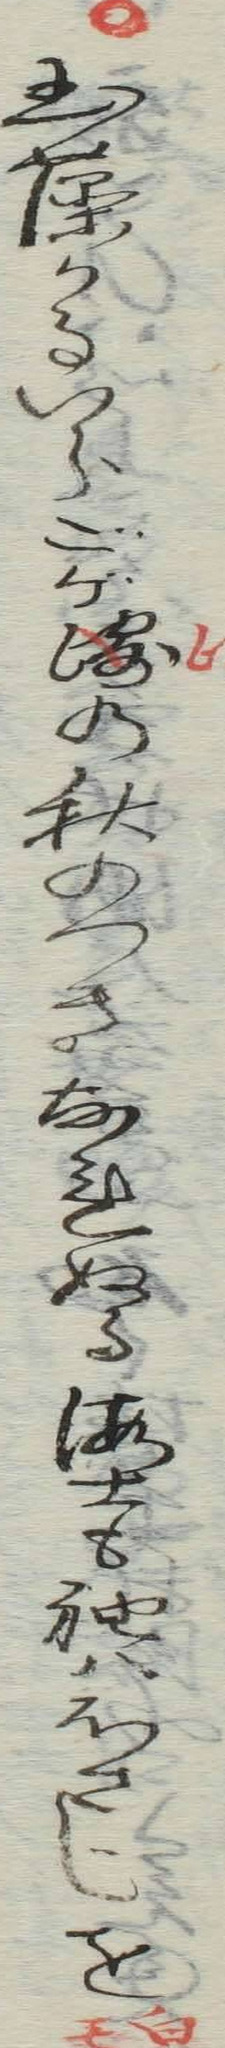○玉藻かるいらごが嶋の秋のつきなれぬる海士も袖はほさじを白モ
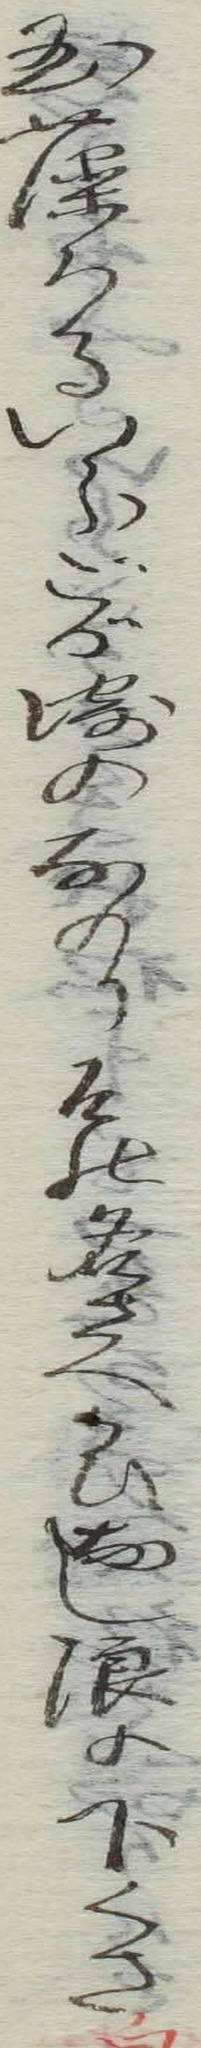玉藻かるいらごが崎のなのりその名さへかひなし浪の下くさ白
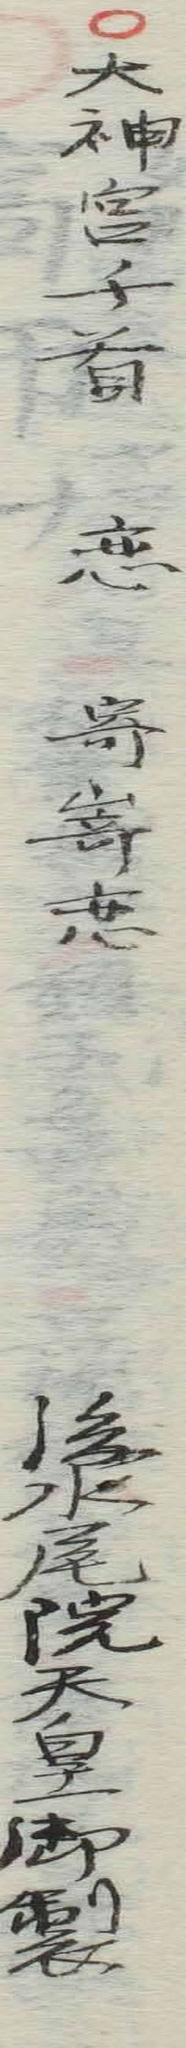○大神宮千首恋寄崎恋後水尾院天皇御製
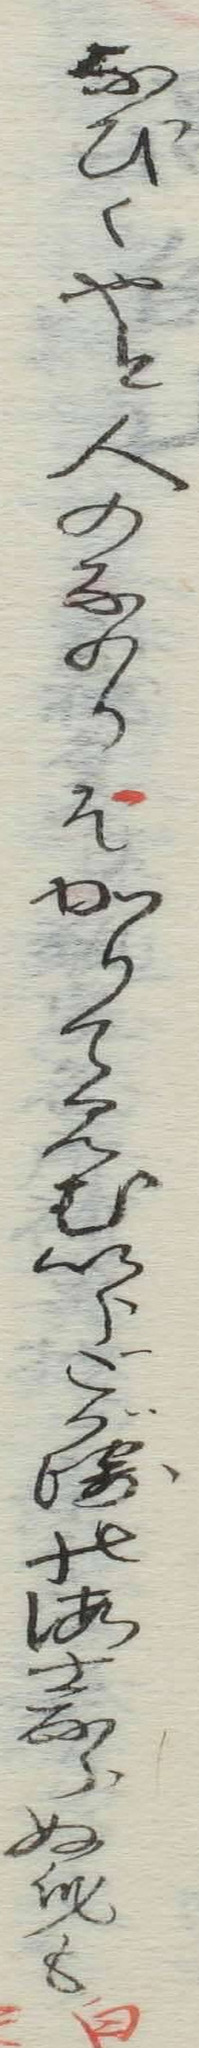なびくやと人のなのりそかりて見むいらごが崎の海士ならぬ身も白モ
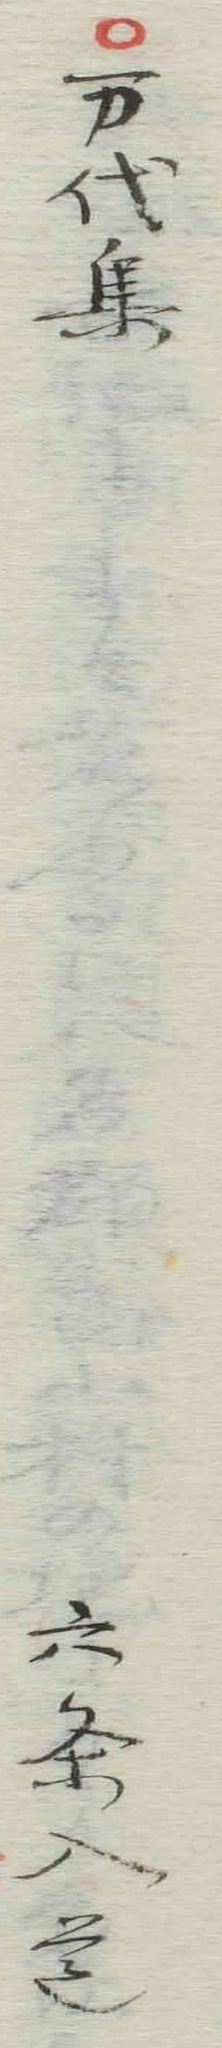○万代集六条入道
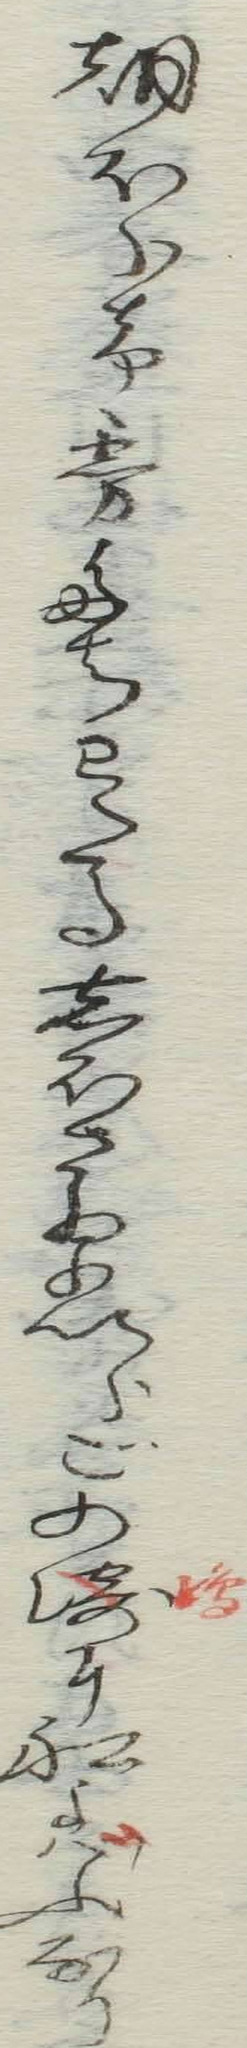朝ほらけ霧たちわたるしほさゐのいらごの嶋に船よばふなり

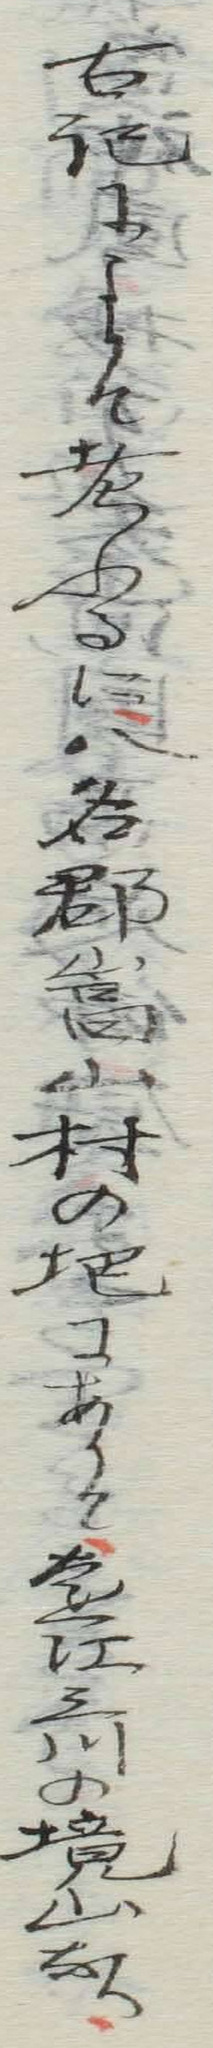古記によりて考ふるに、八名郡嵩山村の地にありて、遠江三川の境山なり、
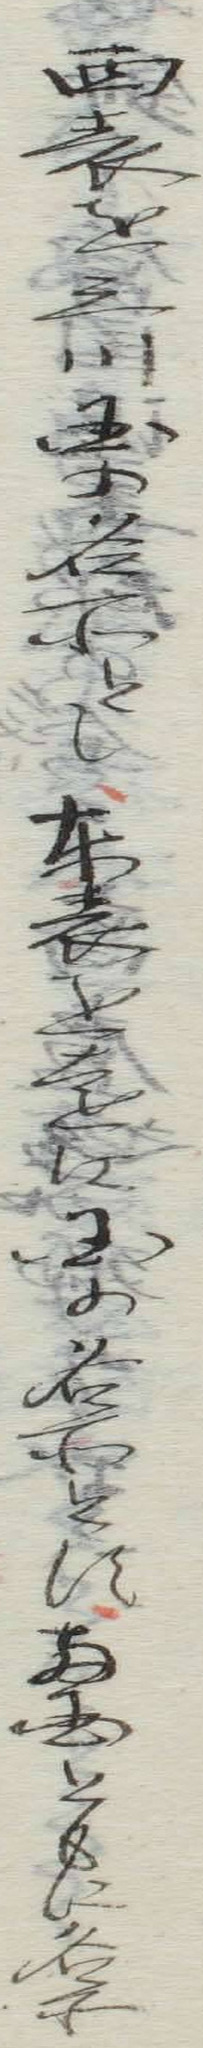西表を三川国の名所とし、本表を遠江国の名所とす、両国ともに名所
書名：三河国古跡考
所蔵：国文学研究資料館
